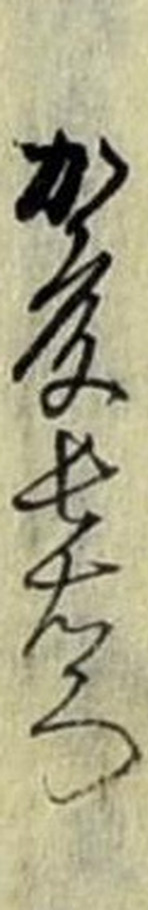加藤長右衛門
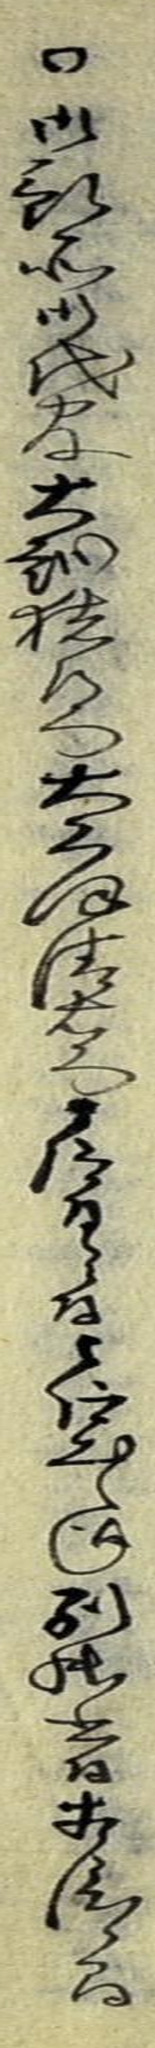〇御預所御代官大越猪左衛門大久保清右衛門被仰付候に付被仰出候趣別紙書付相渡候間
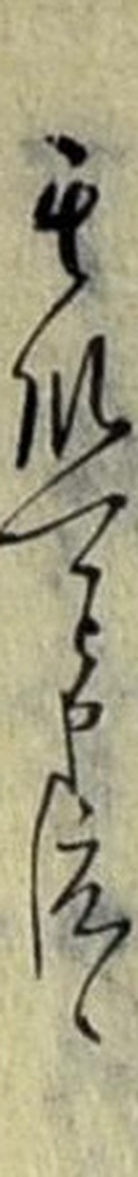其段可被申渡候
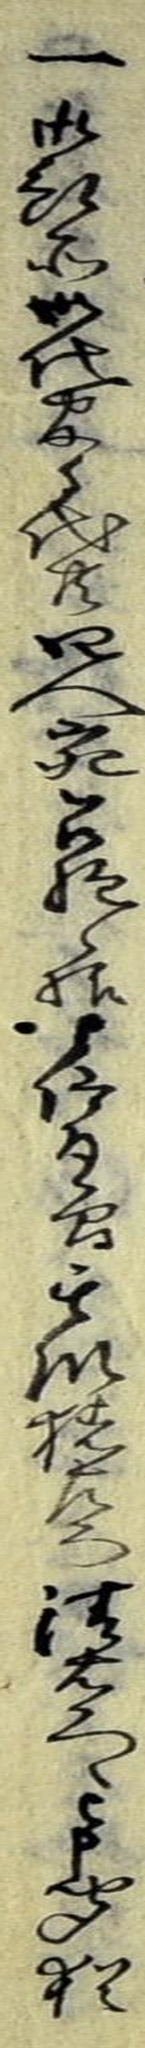一御預所御代官手代共四人宛召抱候様被仰付候間其段猪左衛門清右衛門へ被申聞猶
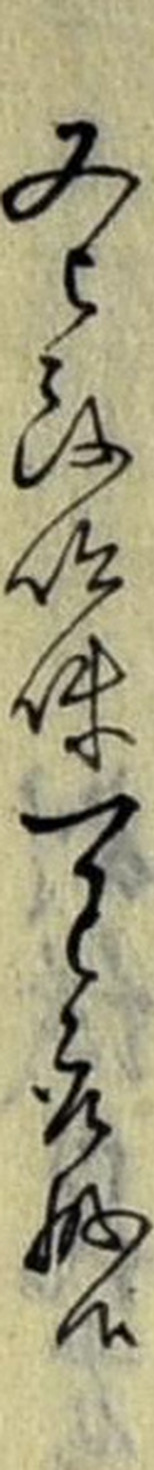又被致吟味可被取扱候

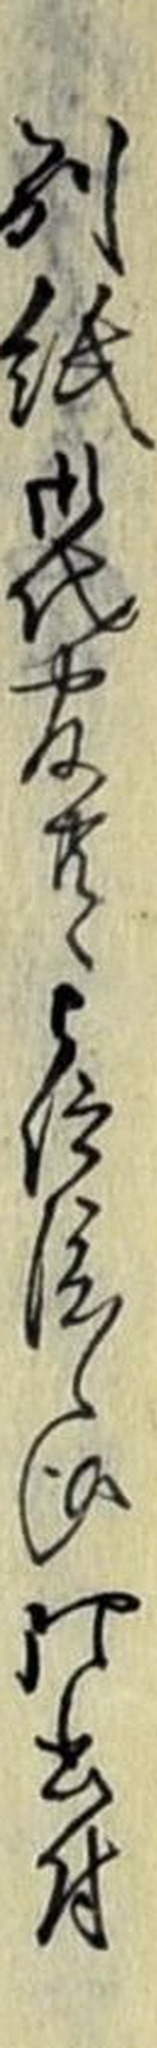別紙御代官共へ被仰渡候趣御書付
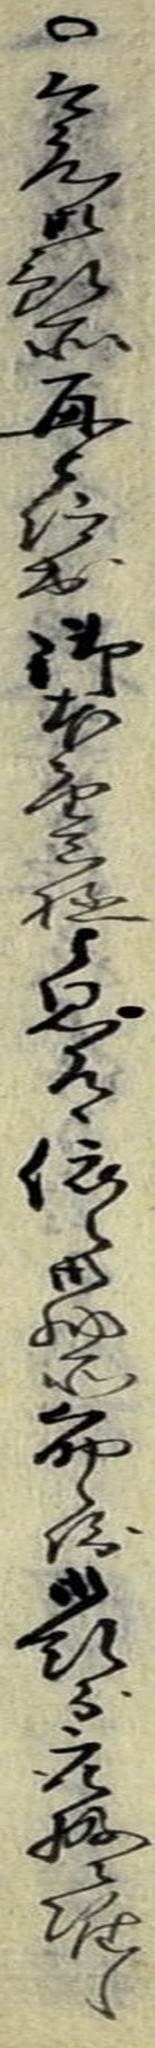〇今度御預所再被仰出御本望至極被思召候依之御預所筋之儀御領分取扱に准し
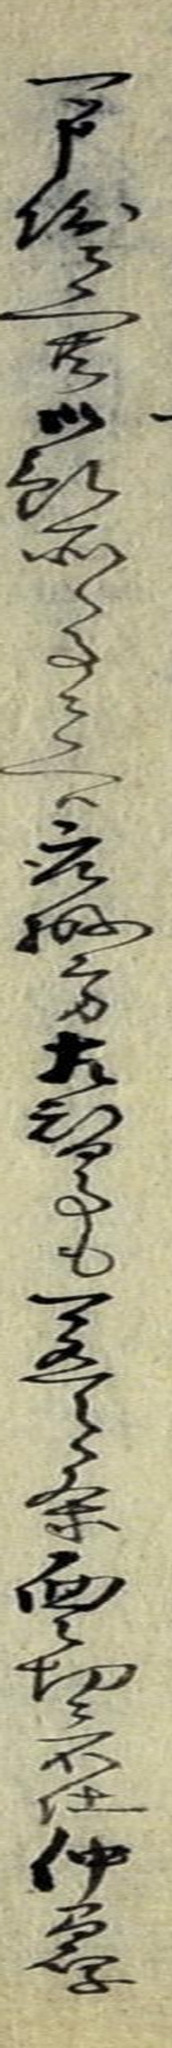可申儀に候へ共御預所之事に候へは取扱方相替事も可有之候条面々切に不仕仲間厚
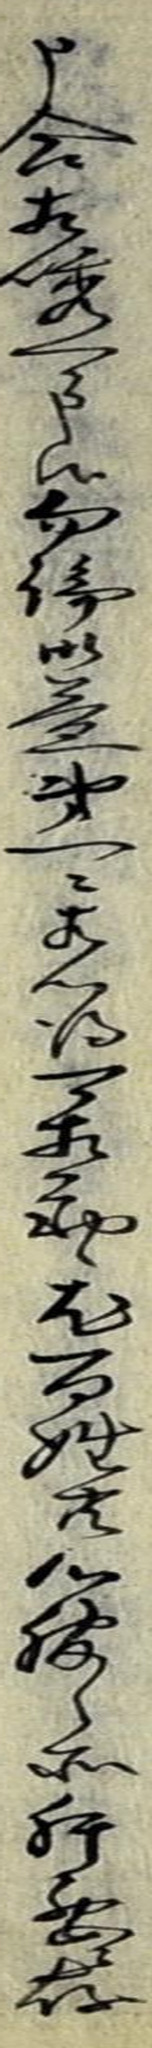申合相誘可申候勿論御益第一に相心得可相勤候尤百姓共心服之所肝要に存
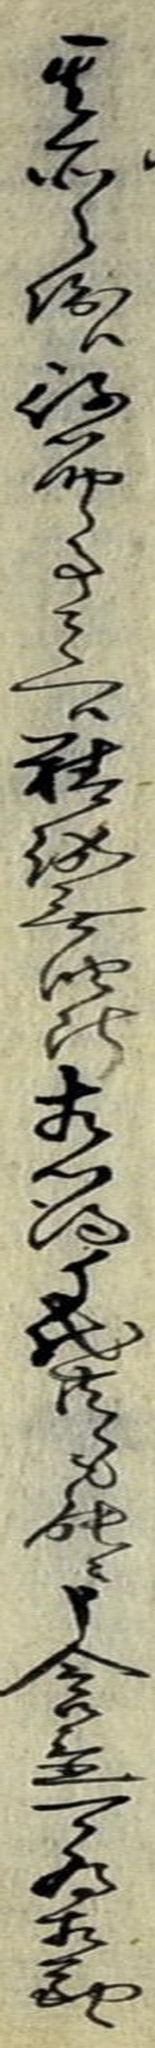其所之儀は役筋之事候へは精誠無油断相心得手代共へも能々申含置可為相勤候
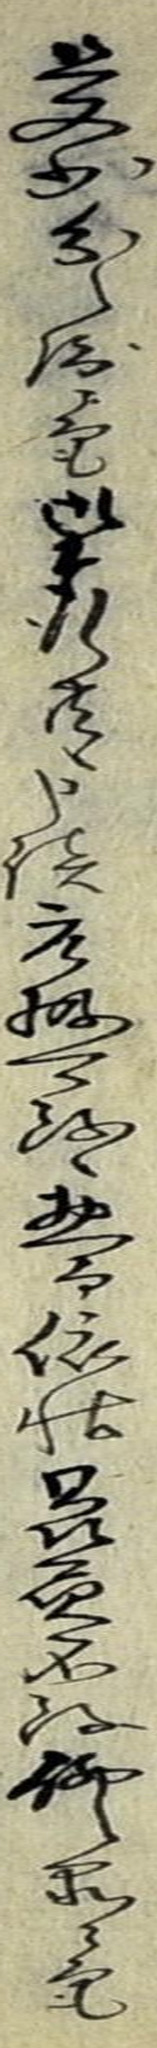且又少分之儀に而も御奉行共へ申談取扱可致候惣而依怙贔屓不致聊之品に而も
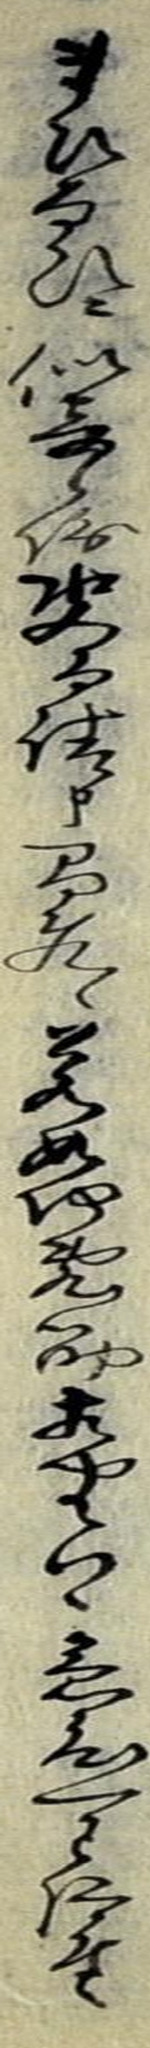まひないに似寄候儀決而請申間敷候若如何敷筋相聞候はゝ急度可被仰付候
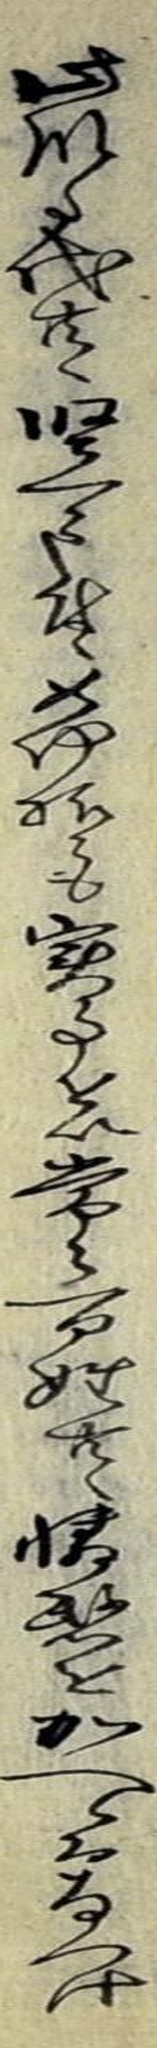此段手代共へ堅可申付候如何様にも実事を以常々百姓共へ憐愍を加へ候而なつけ
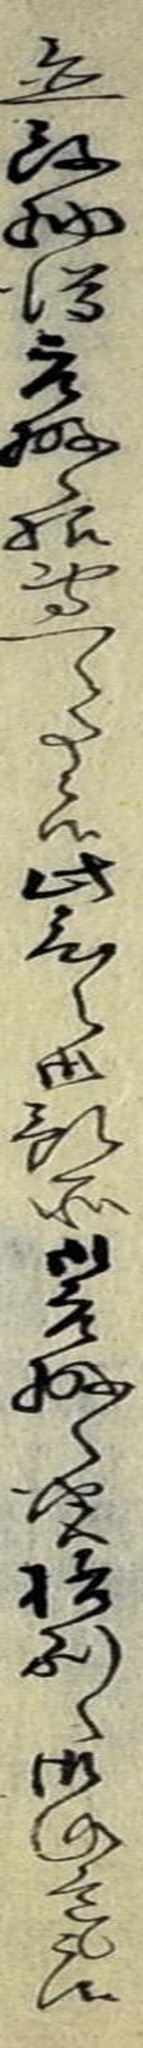置致納得取扱候様第一之事に候此度之御預所御取扱之儀は格別之御趣意も候
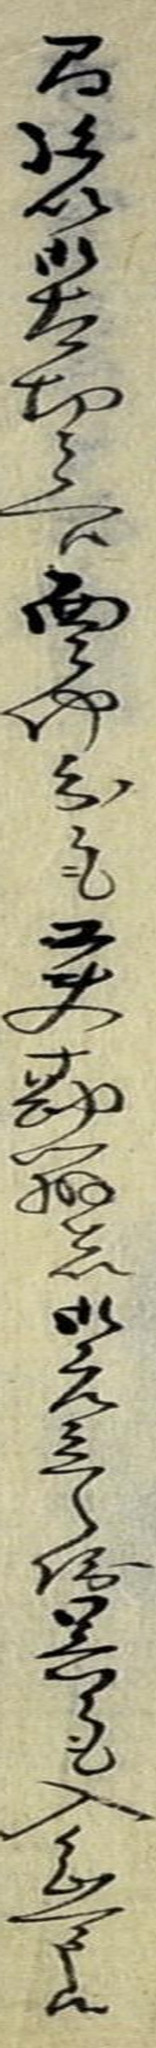間弥以御太切に候へは面々何分にも工夫勘弁を以御取立之儀呉々も入念可申候
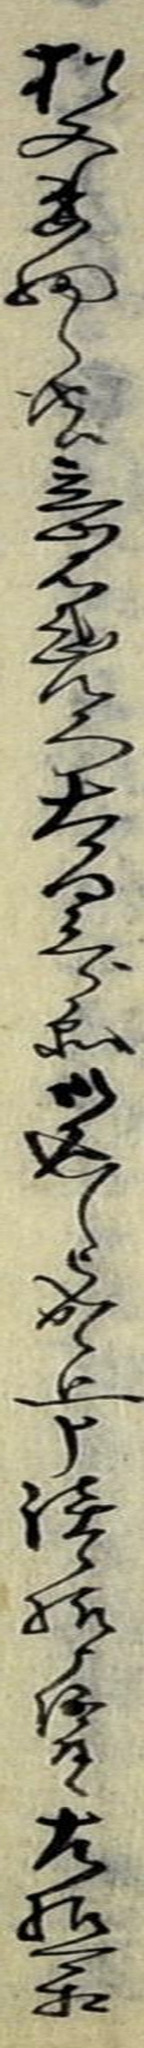猶又委細之儀は立岩武左衛門太田三郎兵衛御返し被成候上申談候様被仰付候左様可相
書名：命令之部 二
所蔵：福井県文書館 Fukui Prefectural Archives
